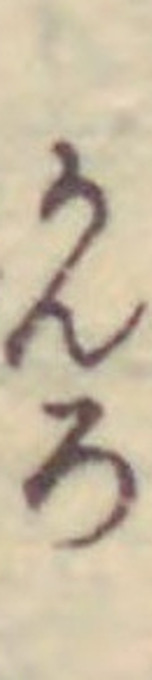かんろ
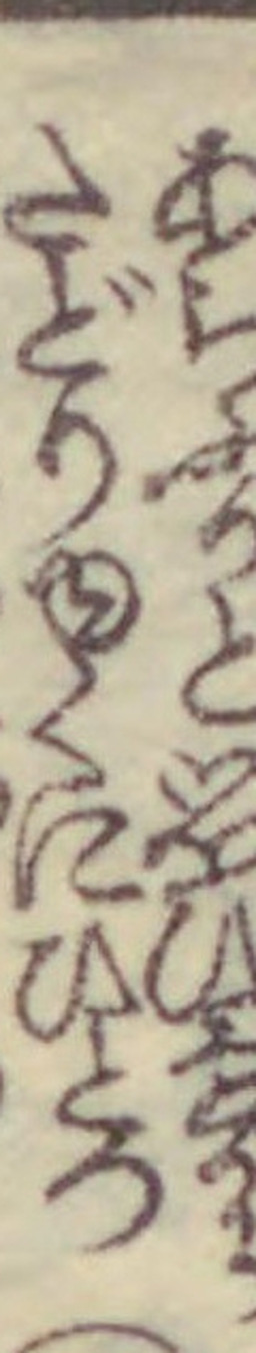たどりゆくにひとつ
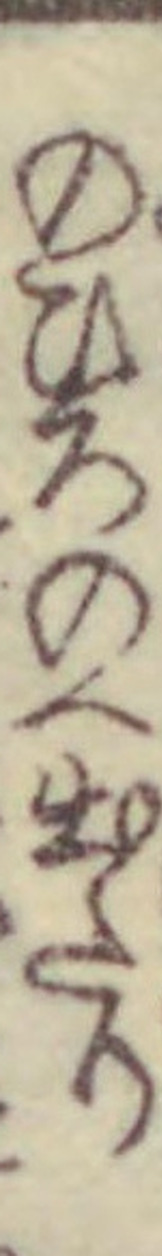のひろのへ出たり
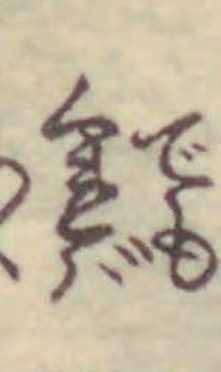くれば
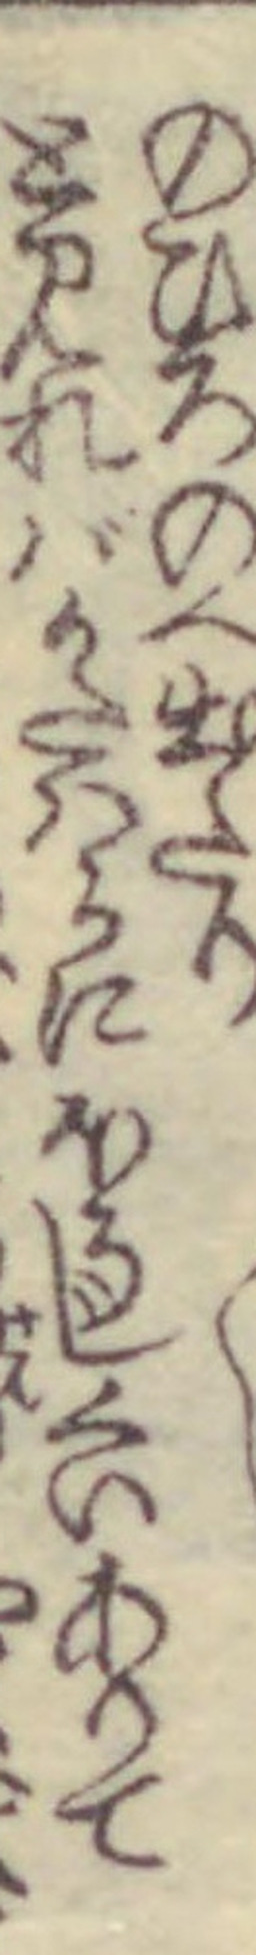と見ればかたはらにほうじくいありて
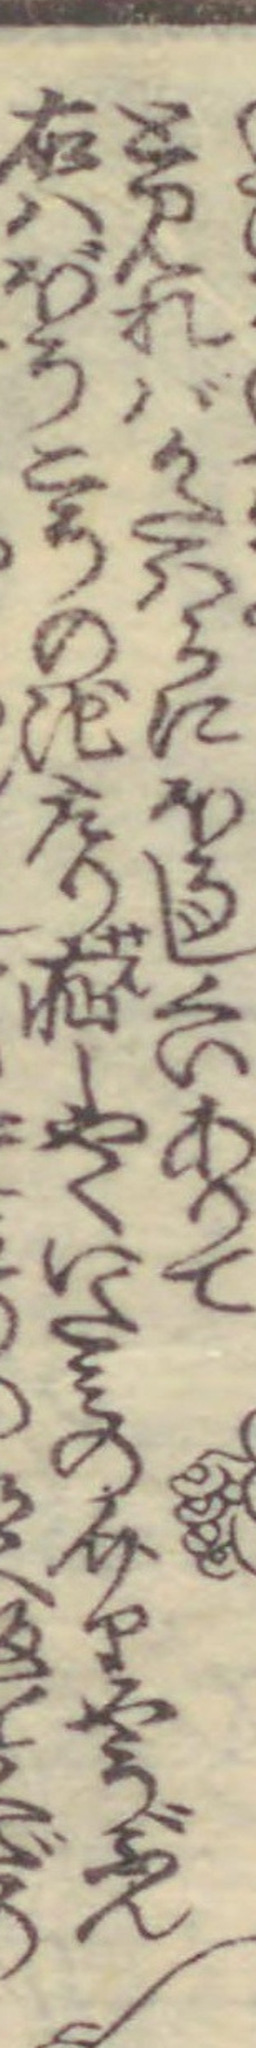右はぼうこうの池左り疝しやくいたみの介りやうぶん
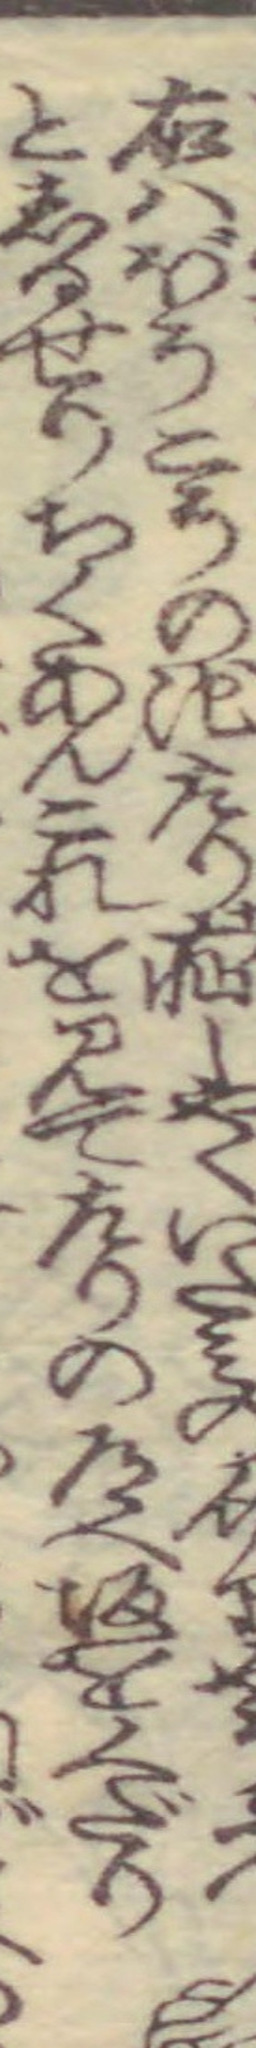としるせりちくあんこれを見て左りの道へ坂をくだり
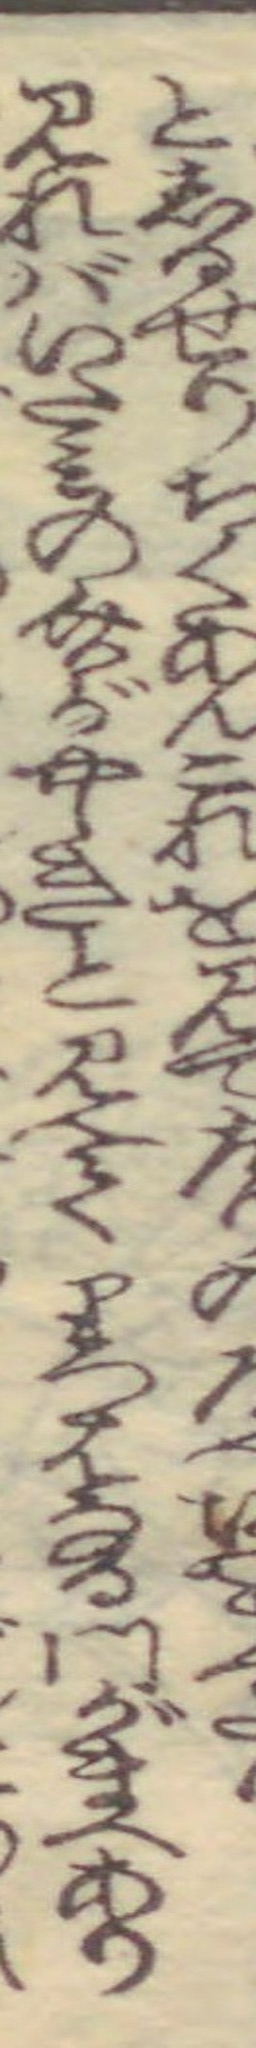見ればいたみの介がやしきと見へてりつはなる門がまへあり
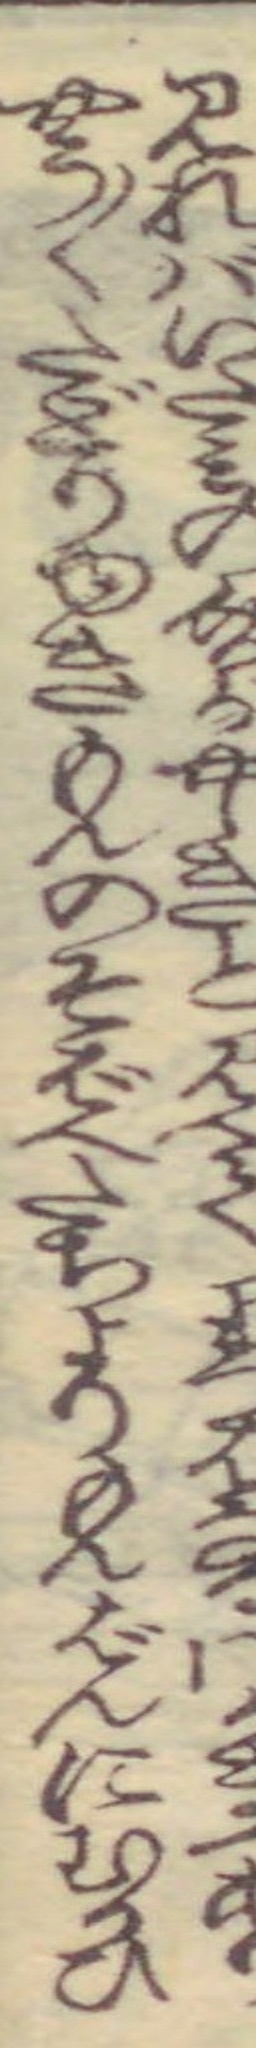やう〳〵たどりゆきもんのそばへたちよりもんばんにむかひ
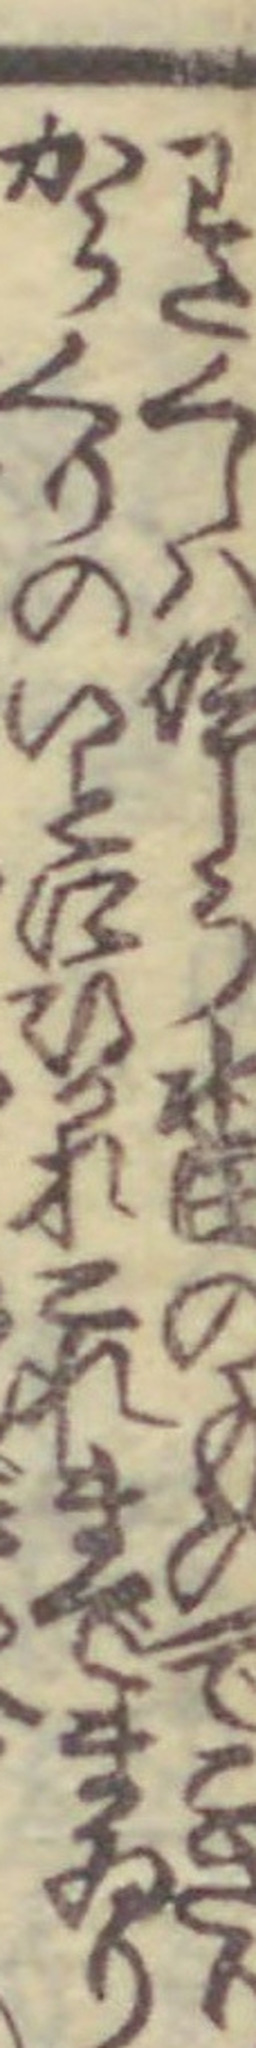からくりのいとにひかれこれまでまゐり
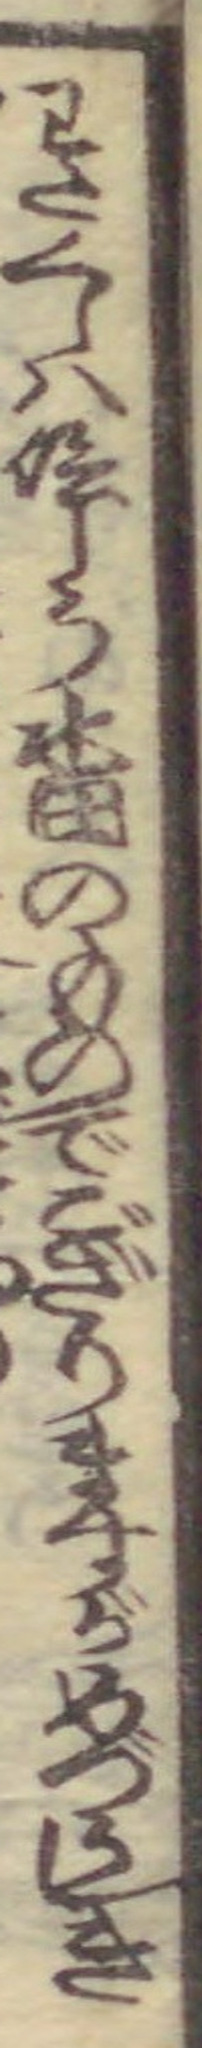わたくしは信しう水田のものでござりますがめづらしき
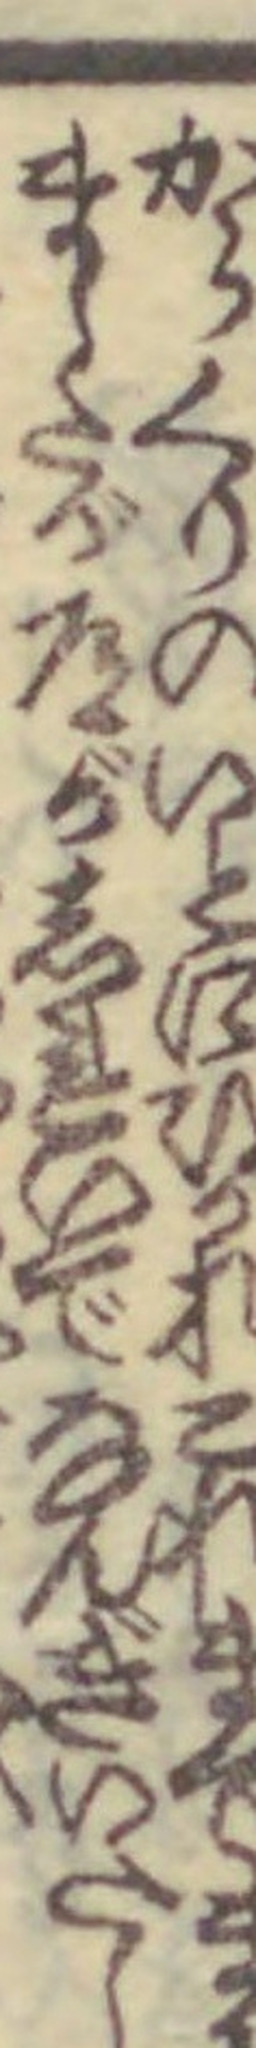ましたが道がしれいでなんぎいたし
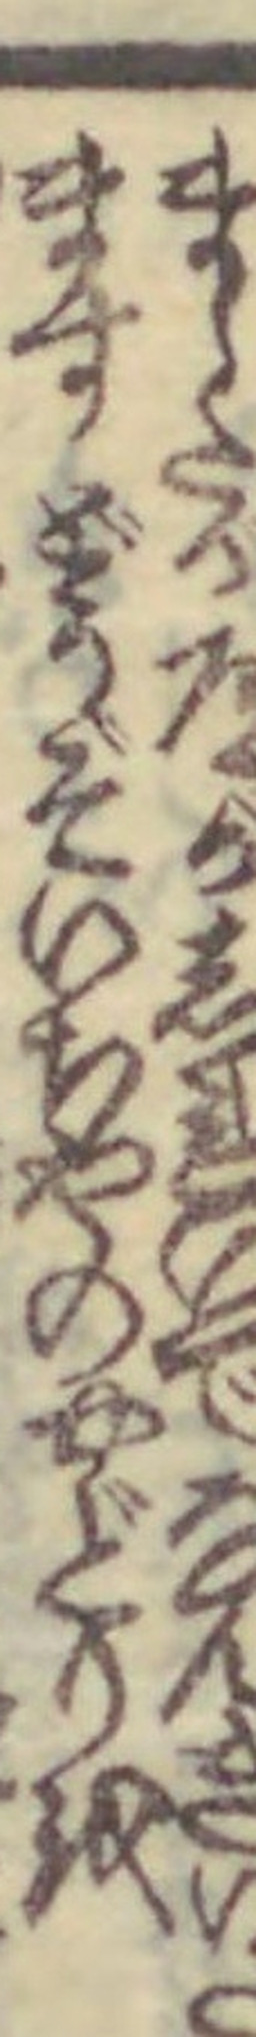ますどうぞいちやのやどりを
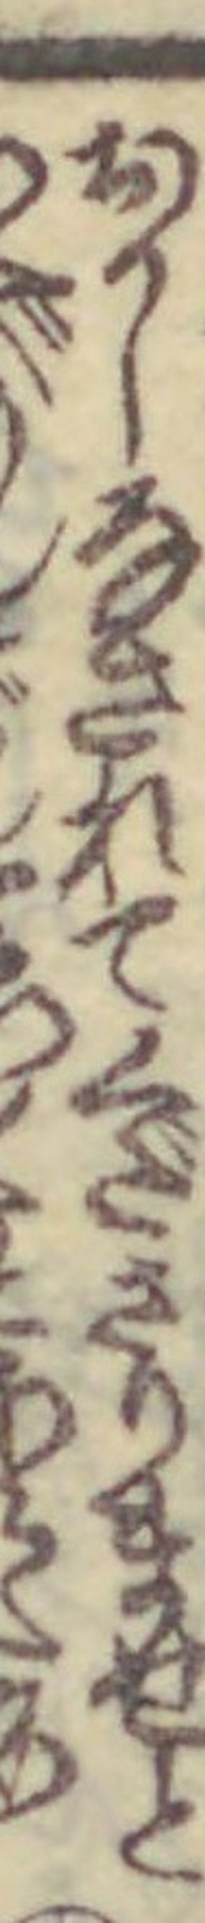おかしなされてくださりませと
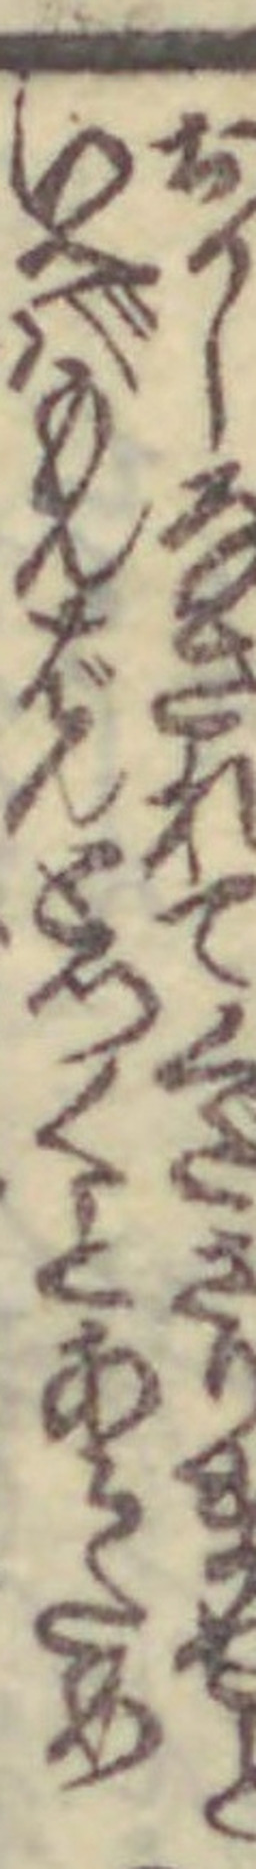いへばもんばんとつくとあらため
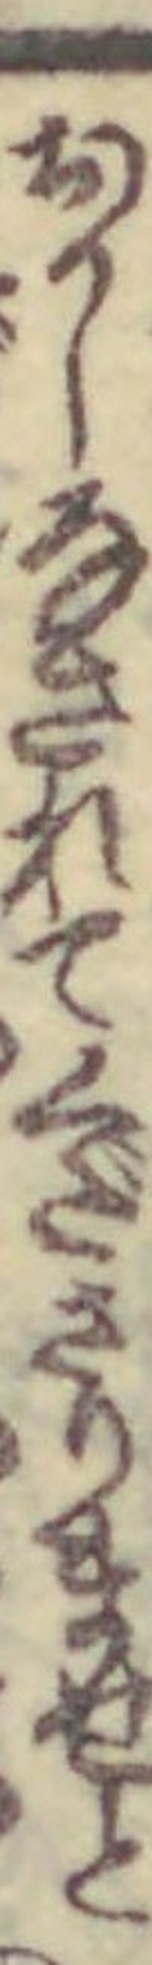おかしなされてくださりませと
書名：腹内窺機関 2巻
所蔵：国立国会図書館 National Diet Library, JAPAN
